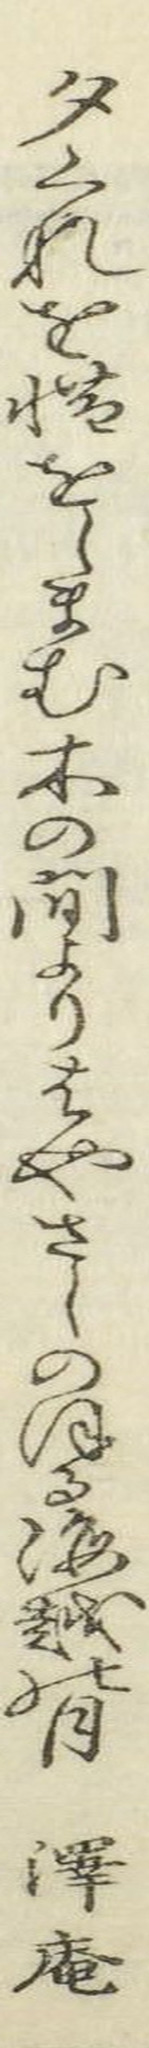夕くれを惜をしまむ木の間よりはやさしのほる海越の月澤庵
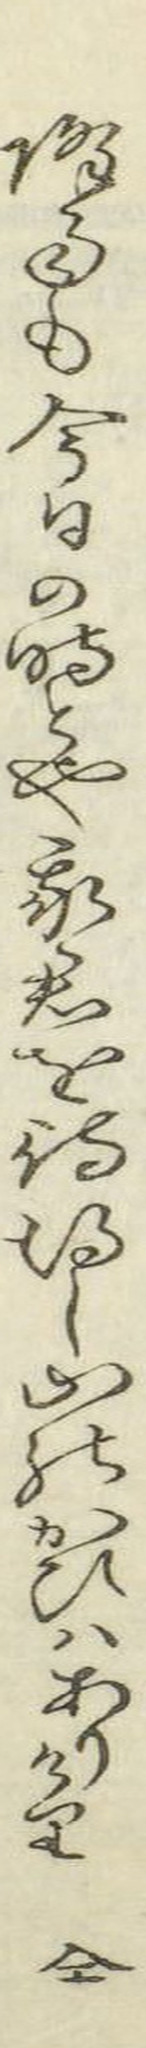降雨も今日の時とや我君を待得し心のかひはありけり仝
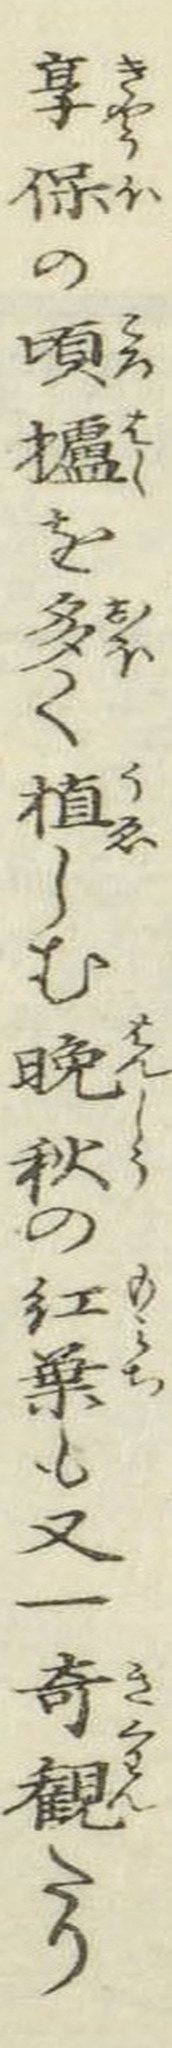享保の頃櫨を多く植しむ晩秋の紅葉も又一奇観たり
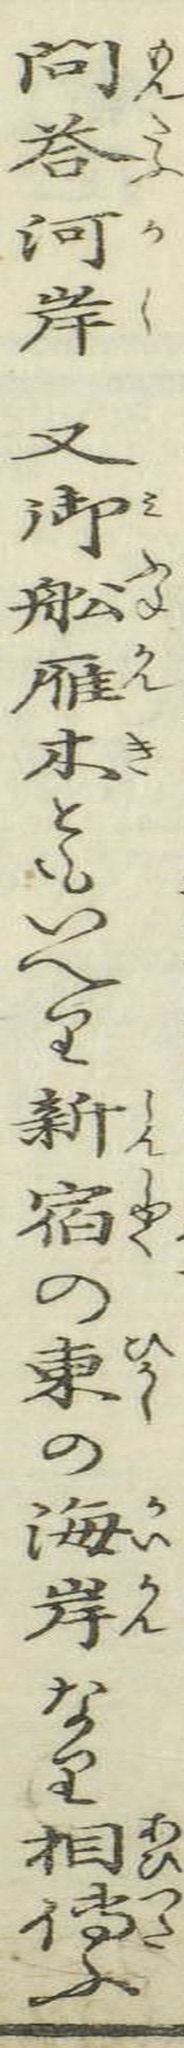問荅河岸又御舩雁木ともいへり新宿の東の海岸なり相傳ふ
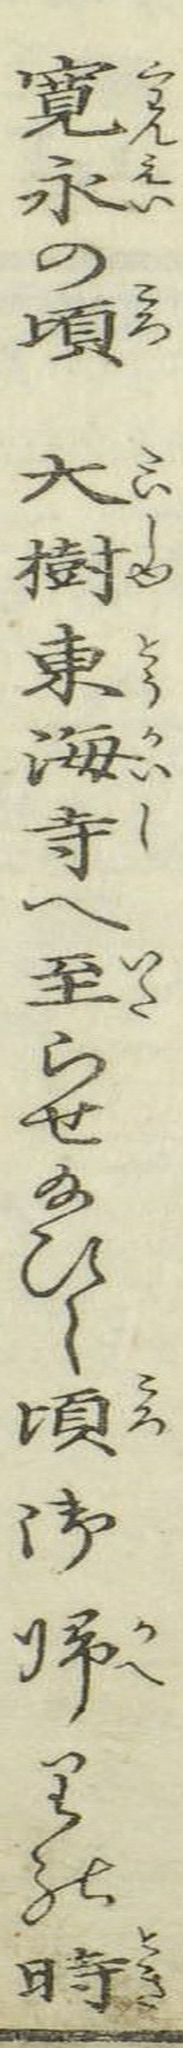寛永の頃大樹東海寺へ至らせ給ひし頃御帰りの時
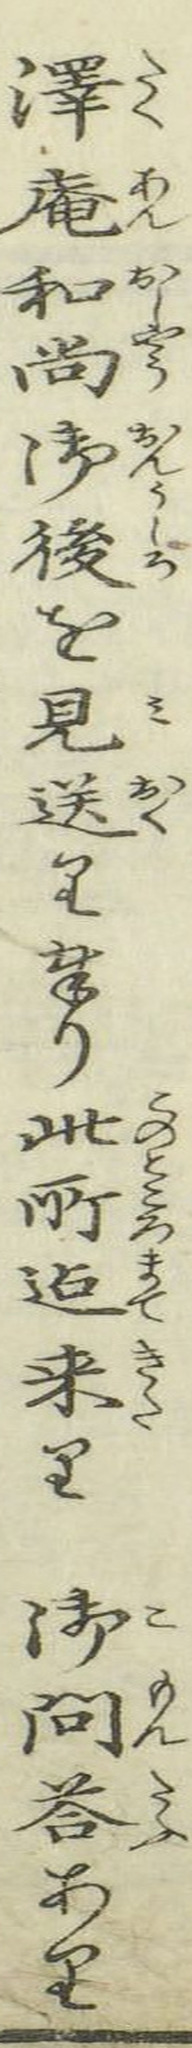澤庵和尚御後を見送り奉り此所迠来り御問荅あり
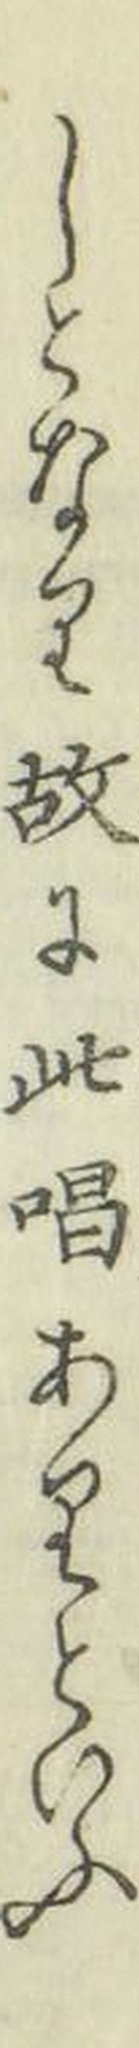しとなり故に此唱ありといふ

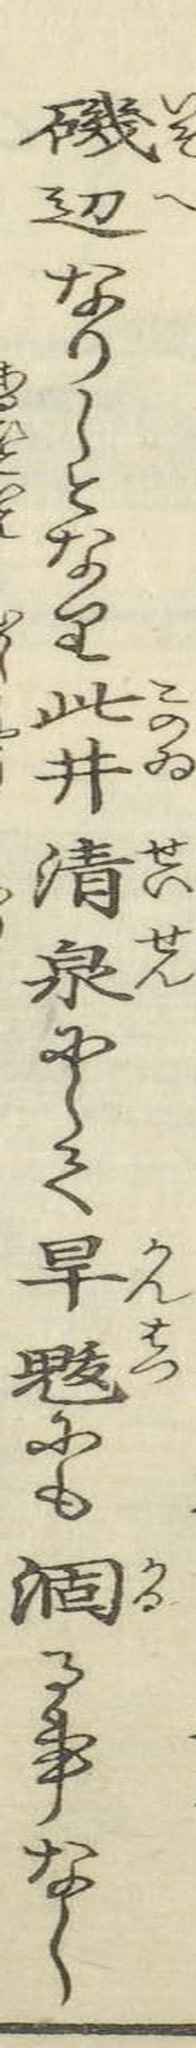磯辺なりしとなり此井清泉にして旱魃にも涸る事なし
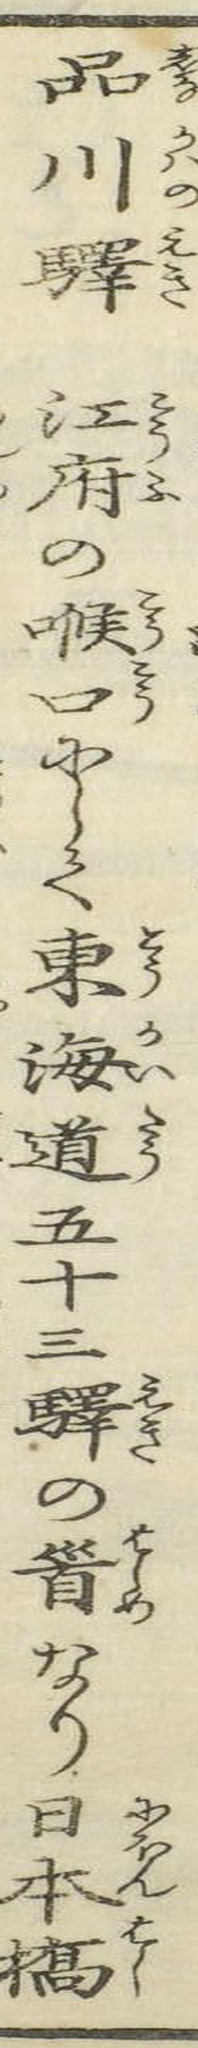品川驛江府の喉口にして東海道五十三驛の𩠐なり日本橋
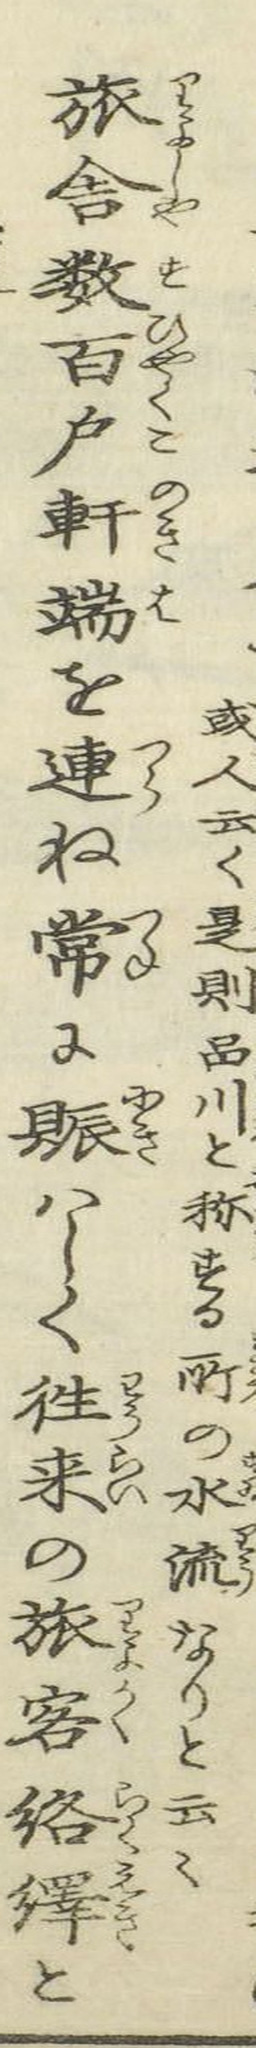旅舎数百戸軒端を連ね常に賑はしく往来の旅客絡驛と
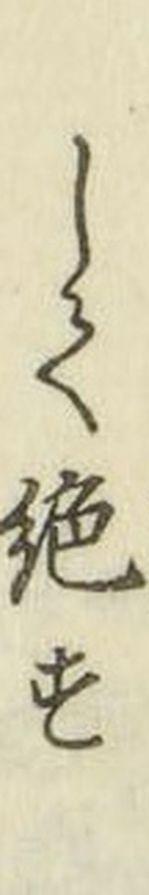して絶す
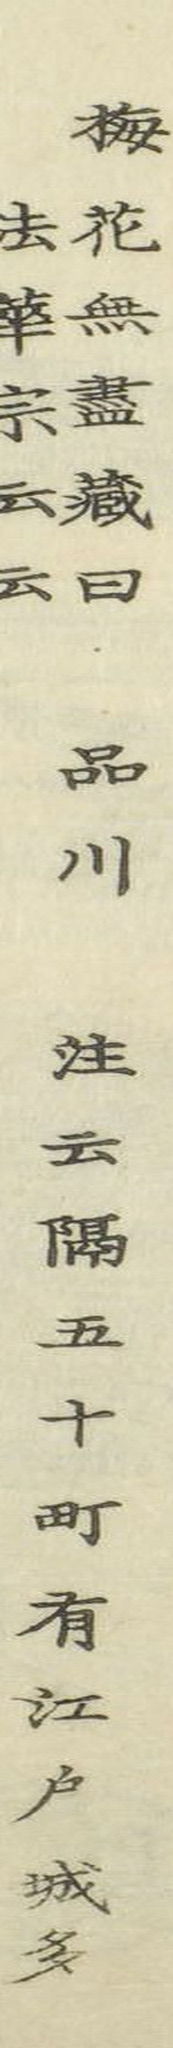梅花無盡藏曰品川注云隔五十町有江戸城多
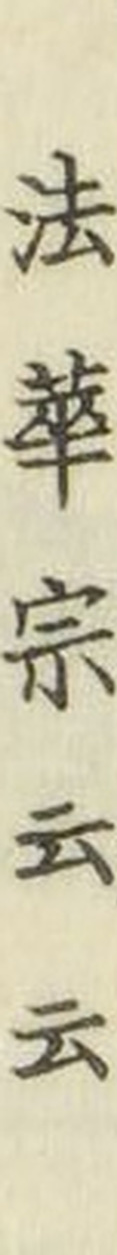法蕐宗云云
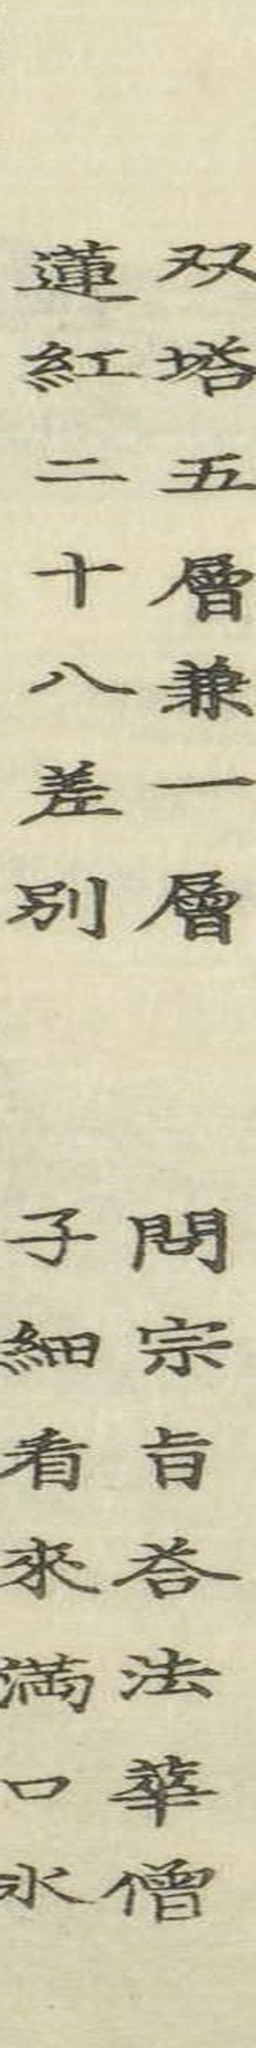蓮紅二十八差別子細看來満口氷
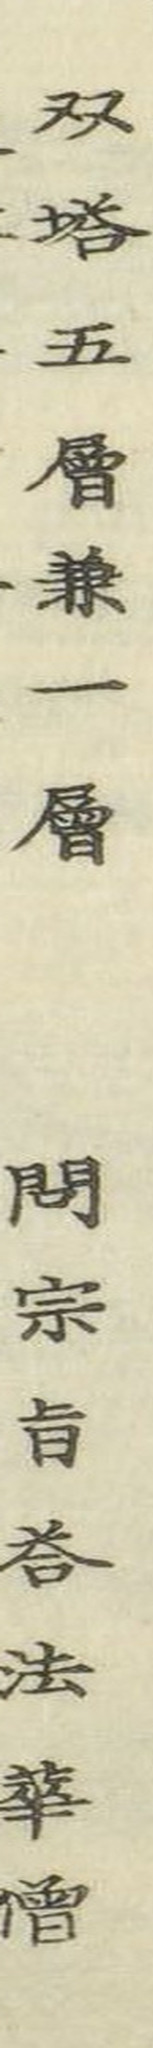双塔五層兼一層問宗旨荅法蕐僧
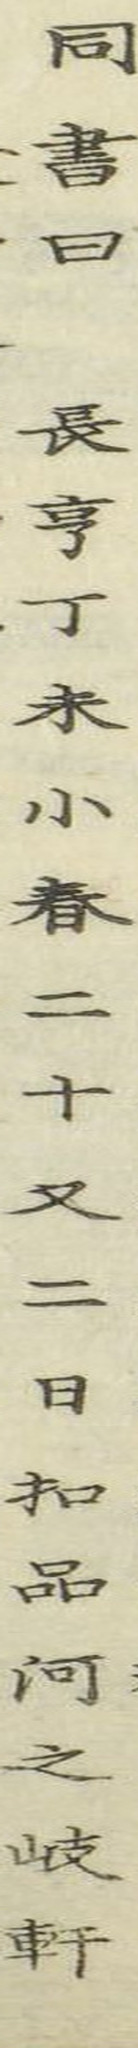同書曰長亨丁未小春二十又二日扣品河之岐軒
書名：江戸名所図会 20巻 巻之4
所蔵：東京学芸大学教育コンテンツアーカイブ
